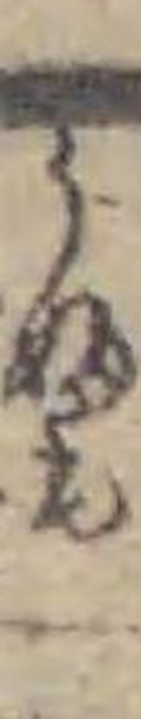うふも
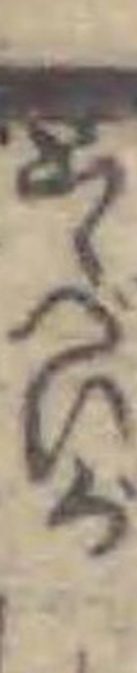とくべいが
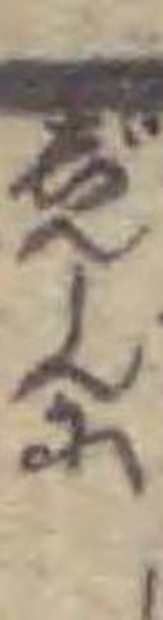じんしんに
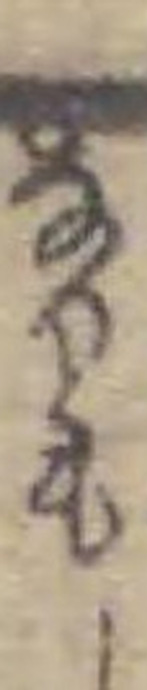なりとも
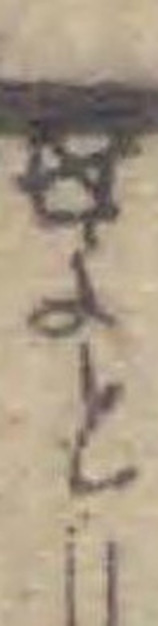せよと
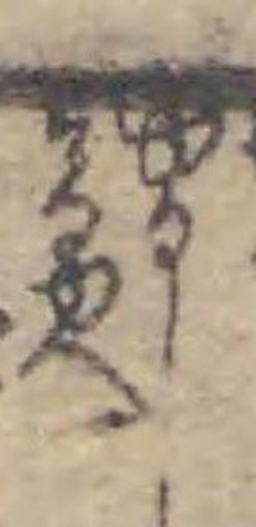けるゆへ
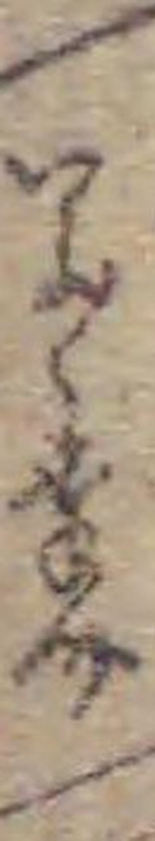いよ〳〵幸介
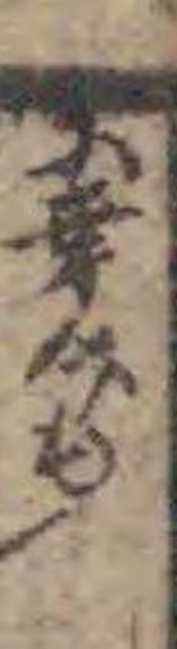に幸介も
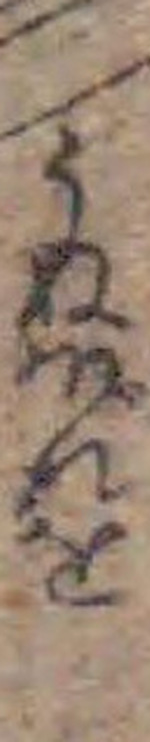うぬぼれを
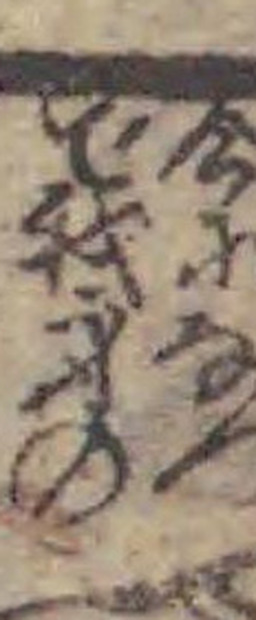て我身の
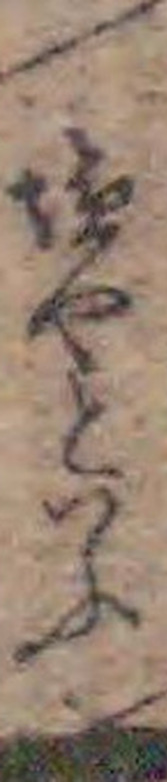塩やといふ
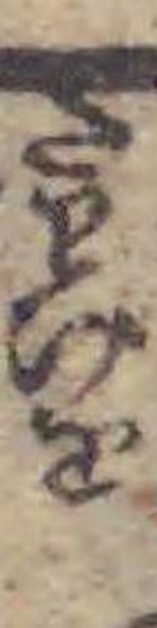たわけを
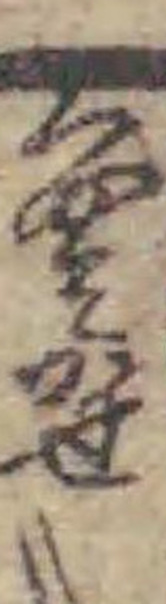くやみかせ
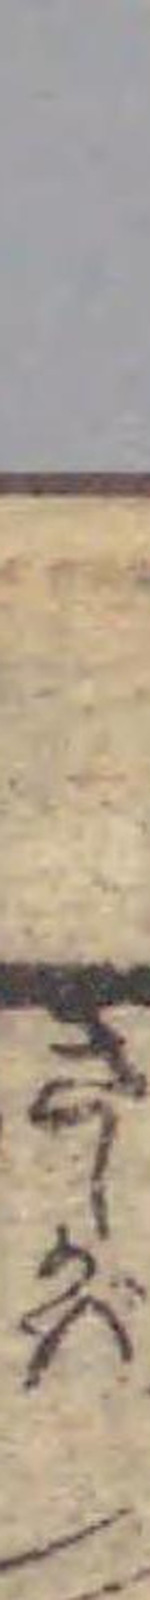ぎしかば
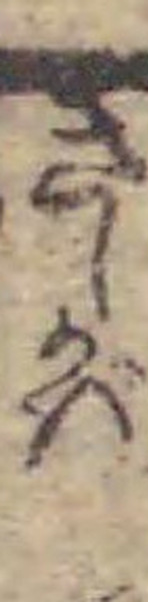ぎしかば
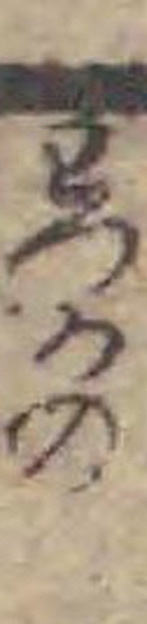わつかの
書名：通風伊勢物語 : 3巻
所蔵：国立国会図書館 National Diet Library, JAPAN
